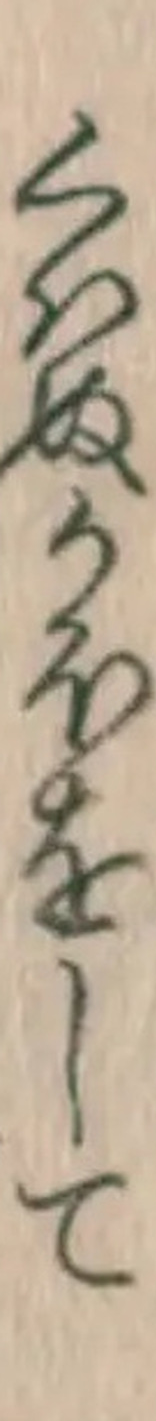くはぬかほをして
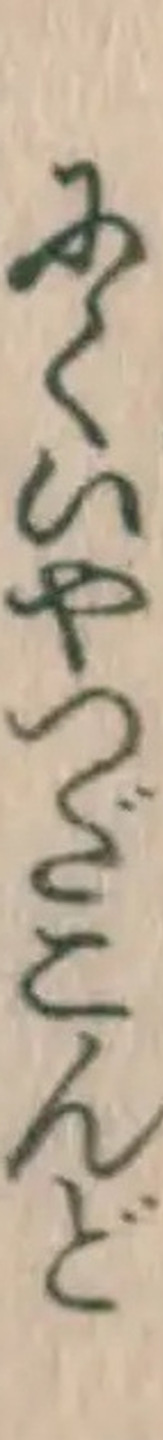にくいやつだこんど
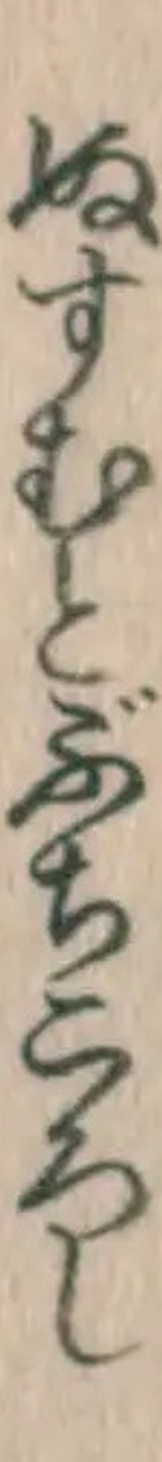ぬすむとぶちころし
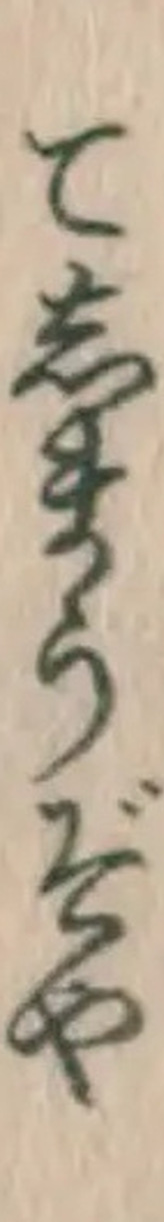てしまうぞや
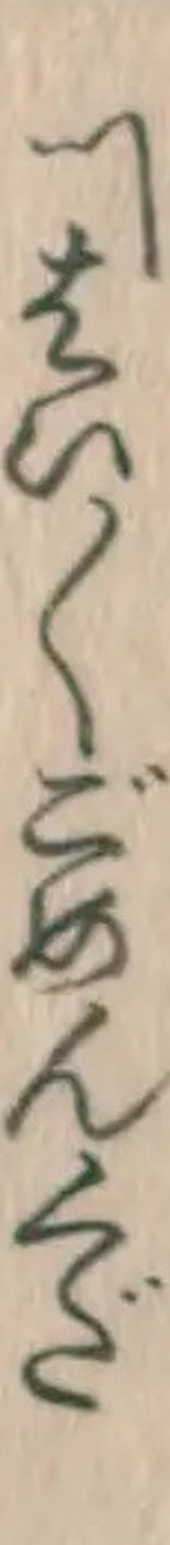〽はい〳〵ごめんくだ
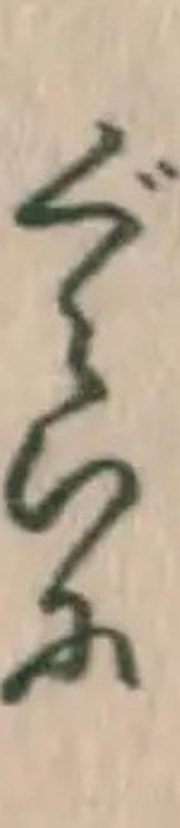ぐらいに
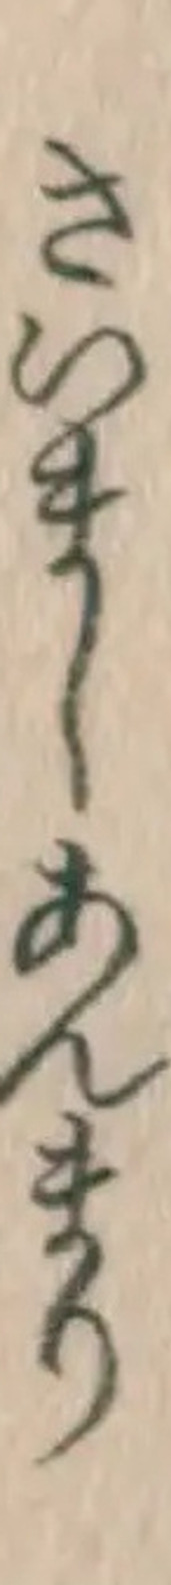さいましあんまり
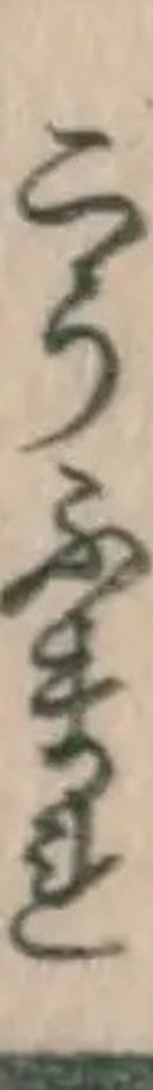こうふまれ
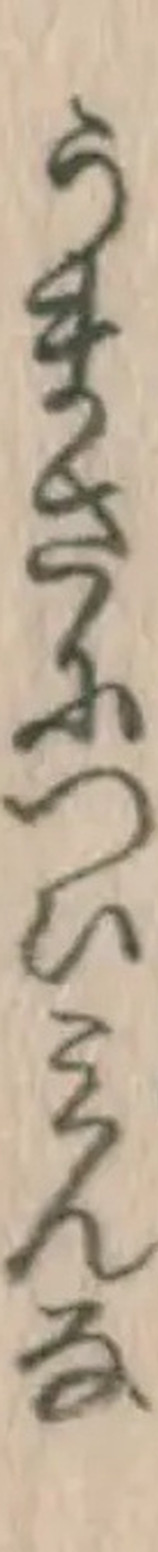うまさについみんな
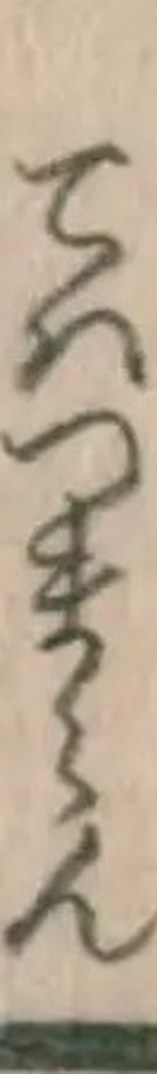てはつまらん
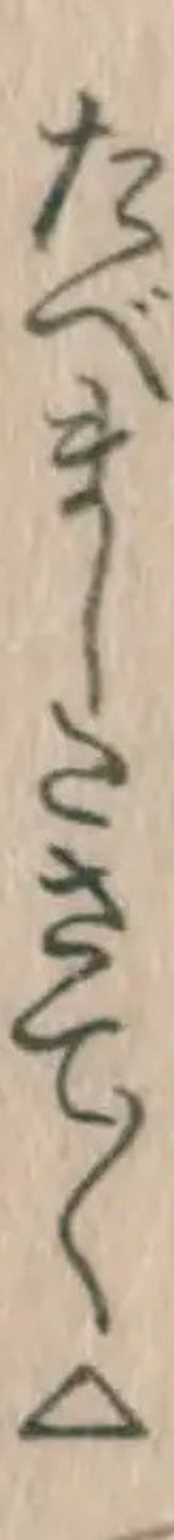たべましたさて〳〵△
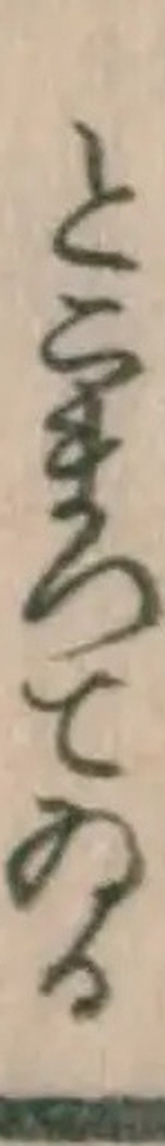とこまつてゐる

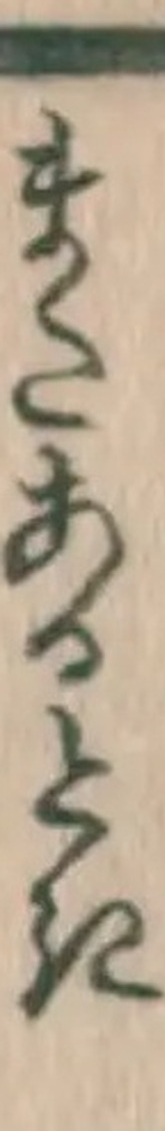またあるとき
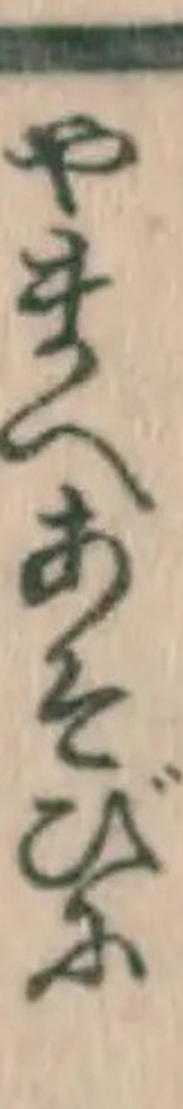やまへあそびに
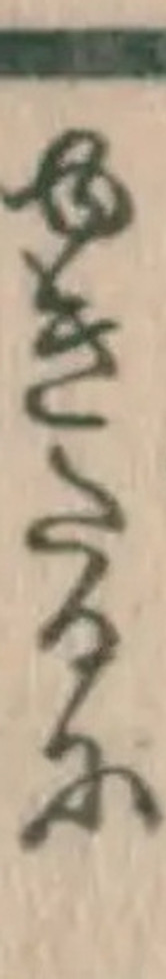ゆきたるに
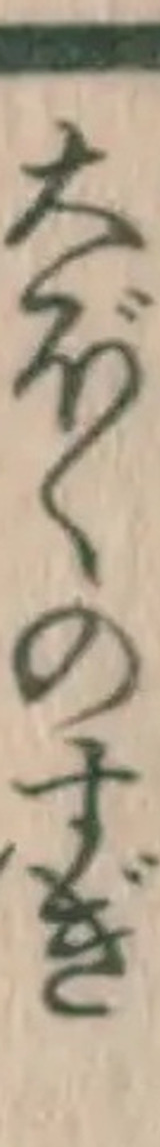大ぼくのすぎ
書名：金太郎
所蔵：国立国会図書館 National Diet Library, JAPAN
